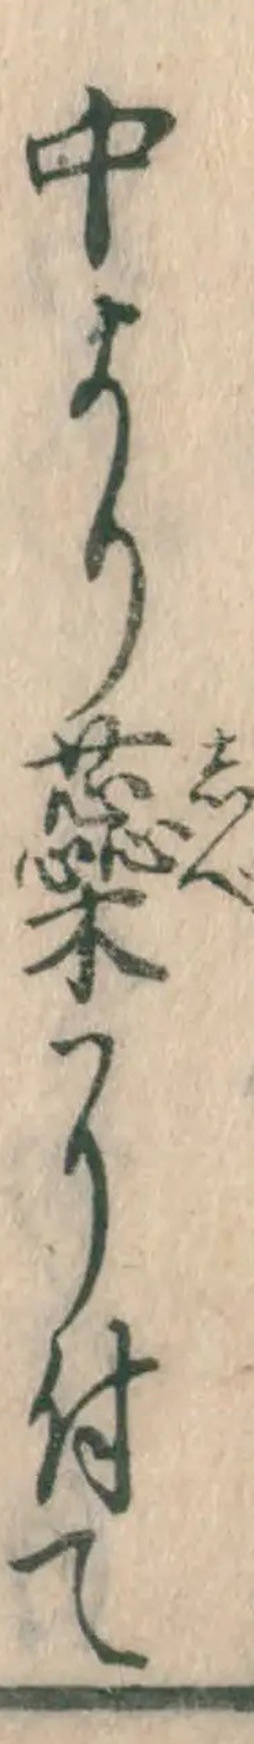中より蘂に付て

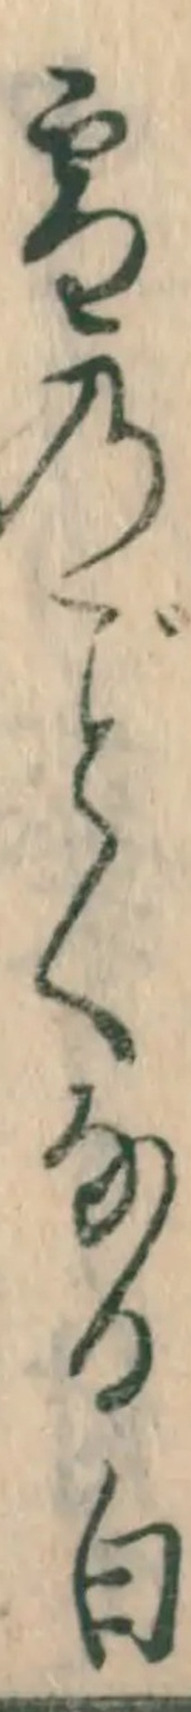雪のごとくなる白
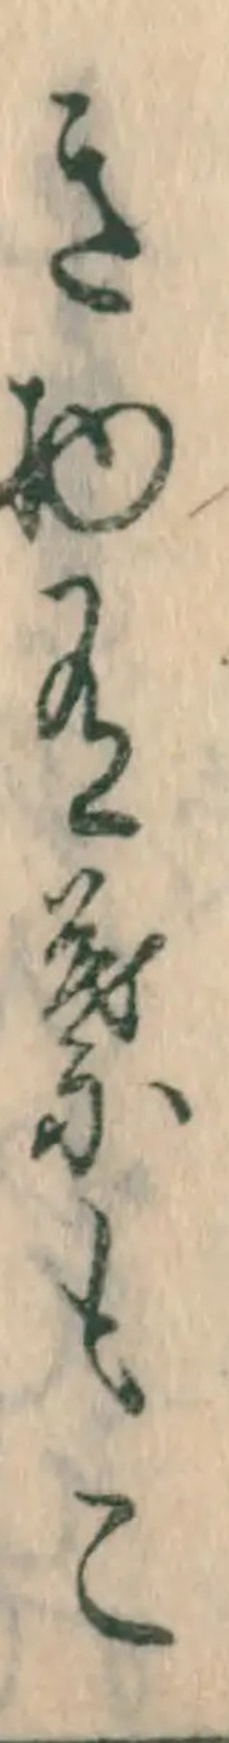き物有葉もこ
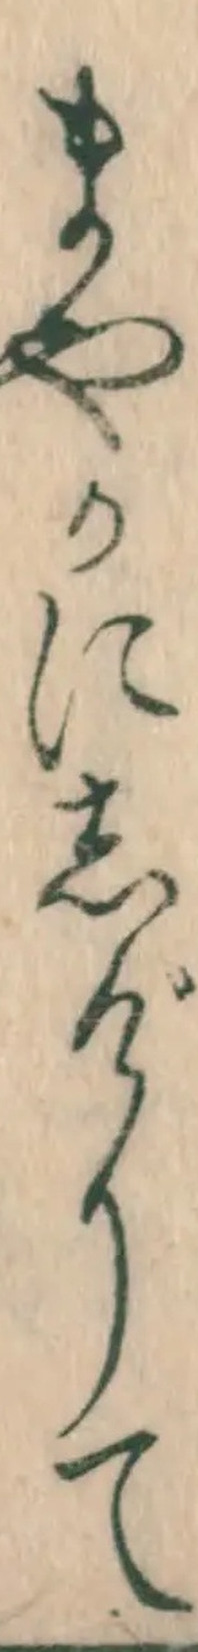まやかにしだりて
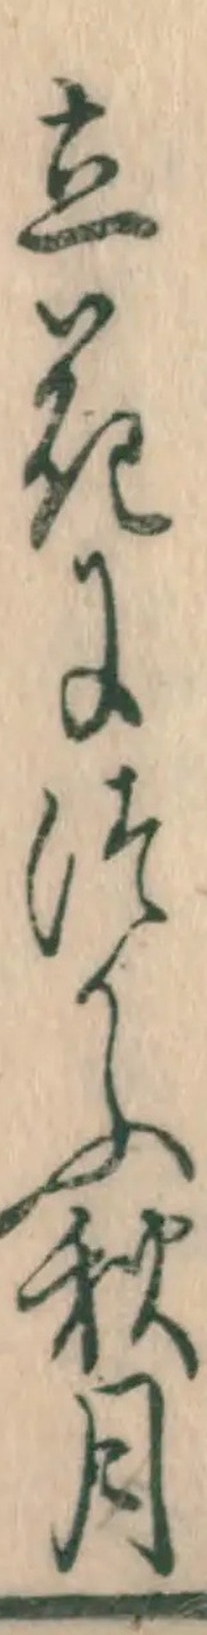立花につかふ秋月
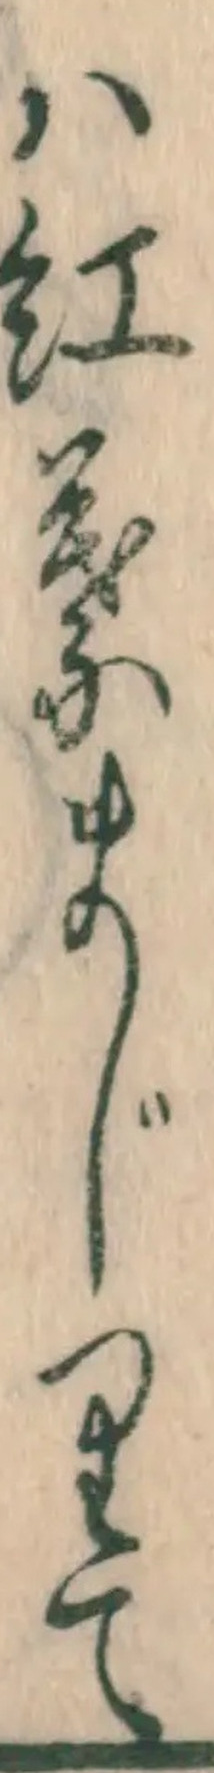は紅葉まじりて
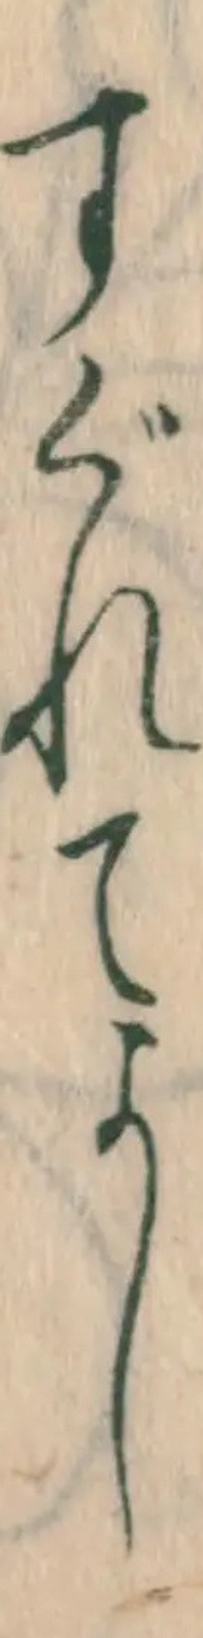すぐれてよし
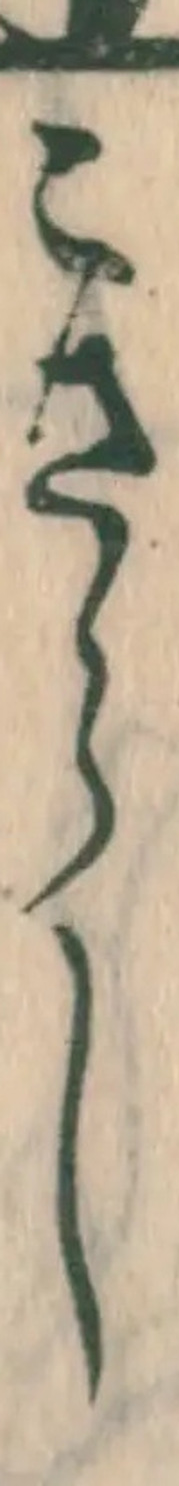こさらし
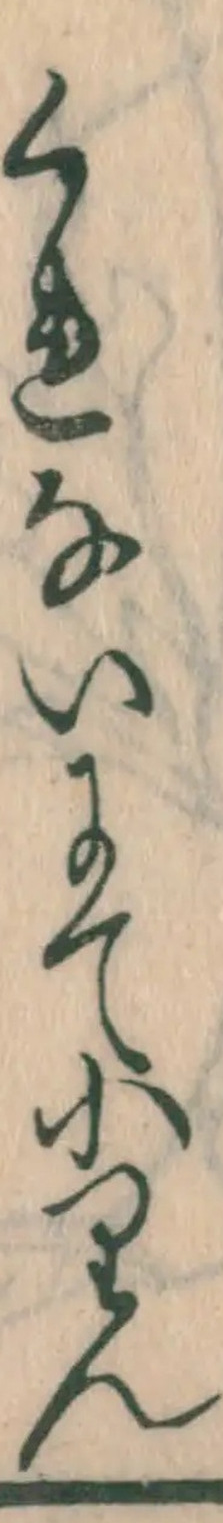くれないにて小りん
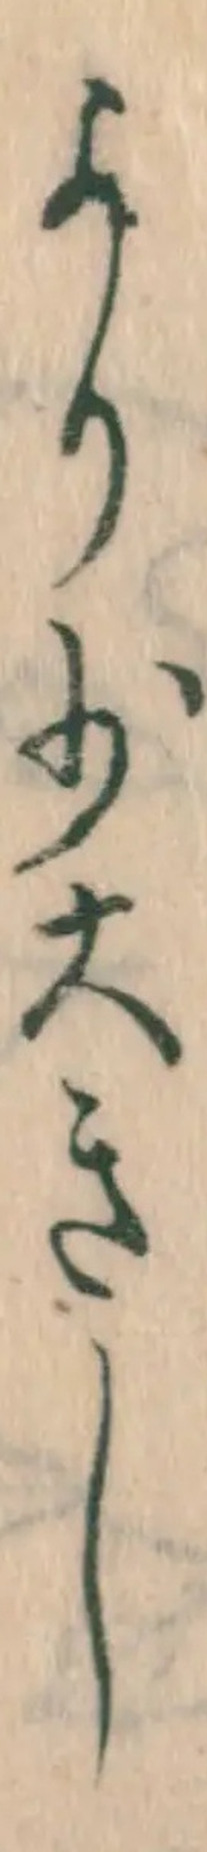より少大きし
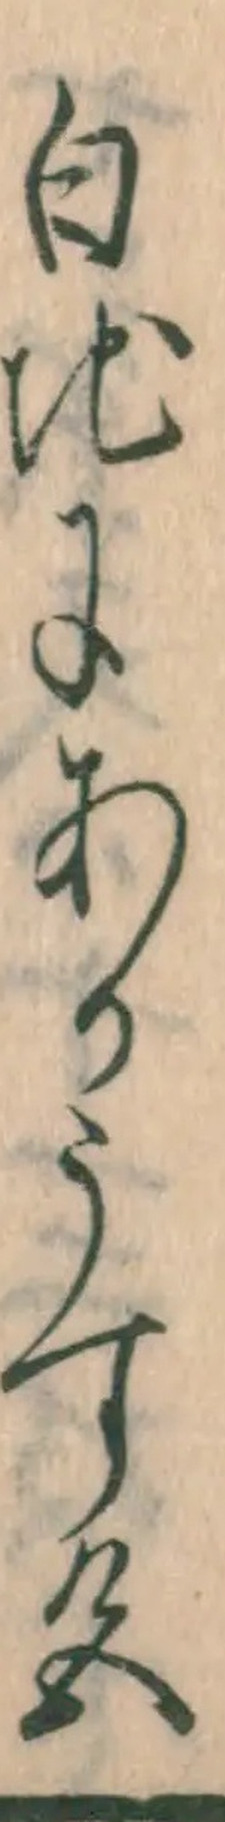白地にあかうす色
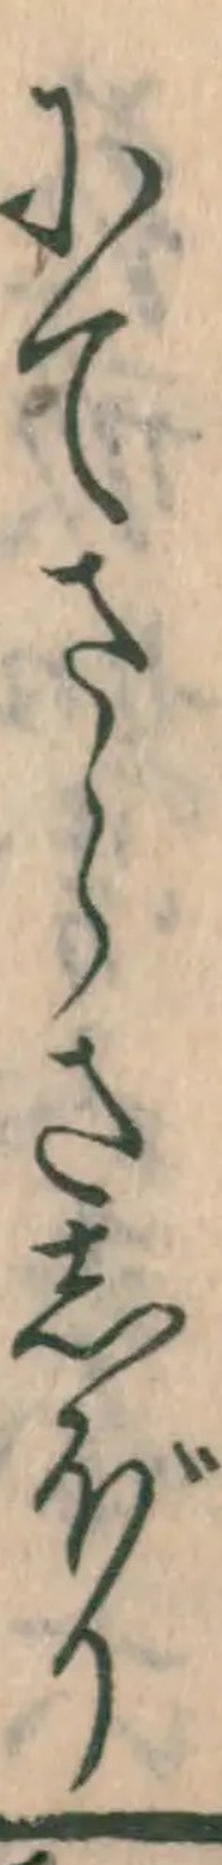にてさらさしぼり
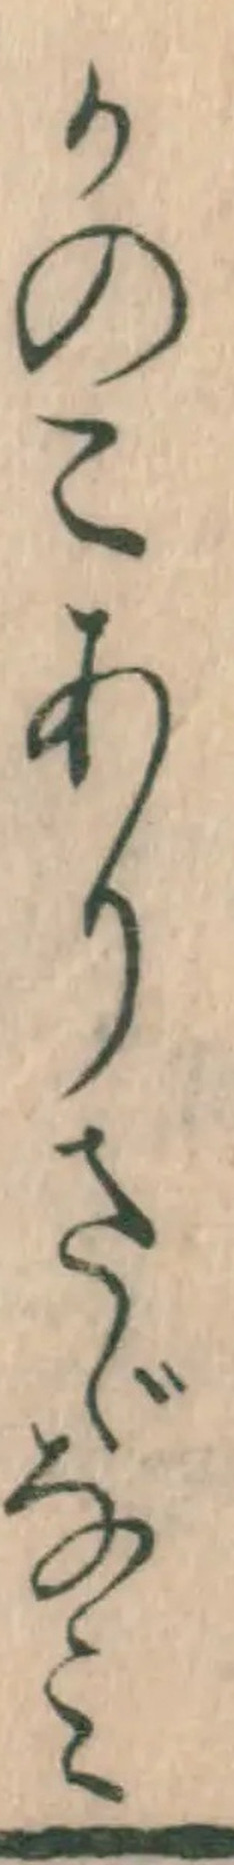かのこありさゞなみ
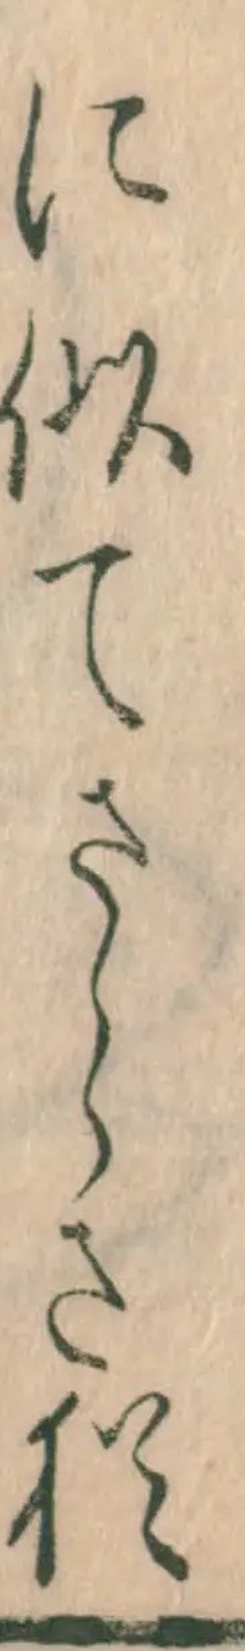に似てさらさ猶
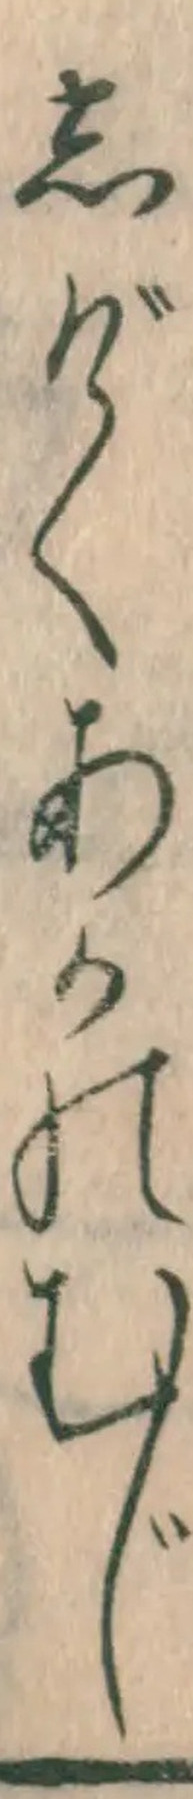しげくあかのむじ
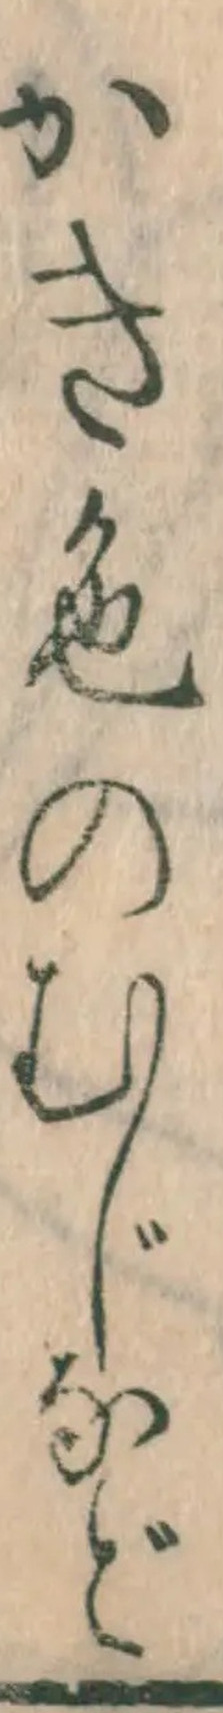かき色のむじなど
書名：錦繍枕 5巻. [4]
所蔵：国立国会図書館 National Diet Library, JAPAN
